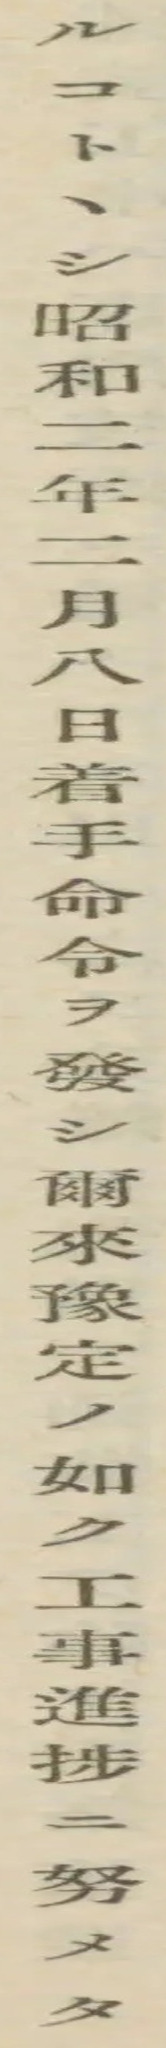ルコトヽシ昭和二年二月八日着手命令ヲ発シ爾来予定ノ如ク工事進歩ニ努メタ
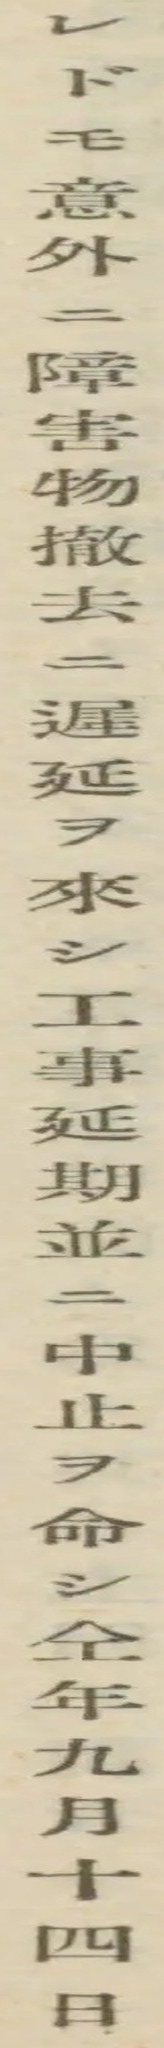レドモ意外ニ障害物撤去ニ遅延ヲ来シ工事延期並ニ中止ヲ命シ仝年九月十四日
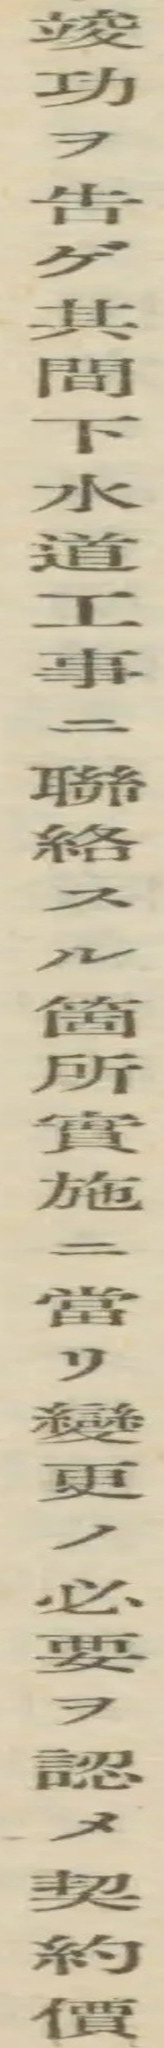竣功ヲ告ゲ其間下水道工事ニ連絡スル箇所実施ニ当リ変更ノ必要ヲ認メ契約値
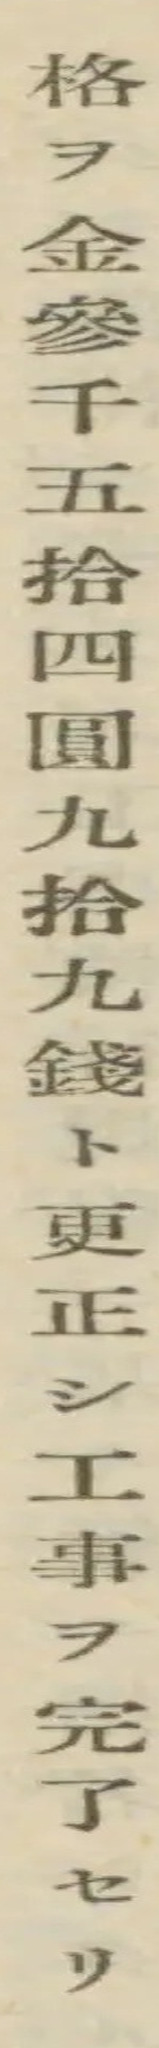格ヲ金三千五十四円九十九銭ト更正シ工事ヲ完了セリ
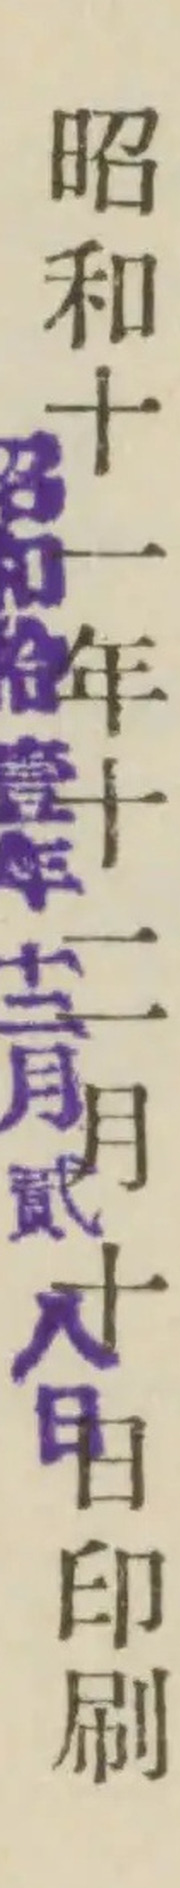昭和十一年十二月十日印刷
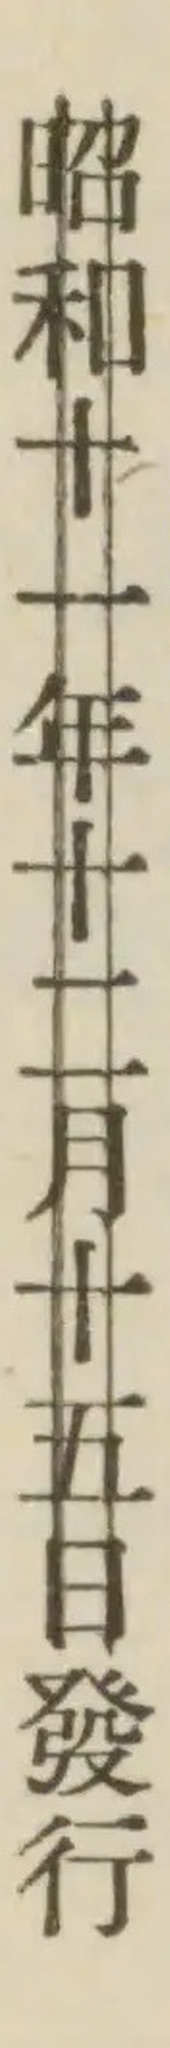昭和十一年十二月十五日発行
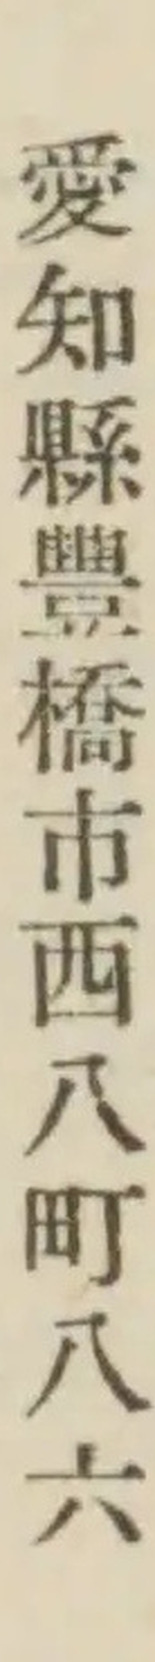愛知県豊橋市西八町八六
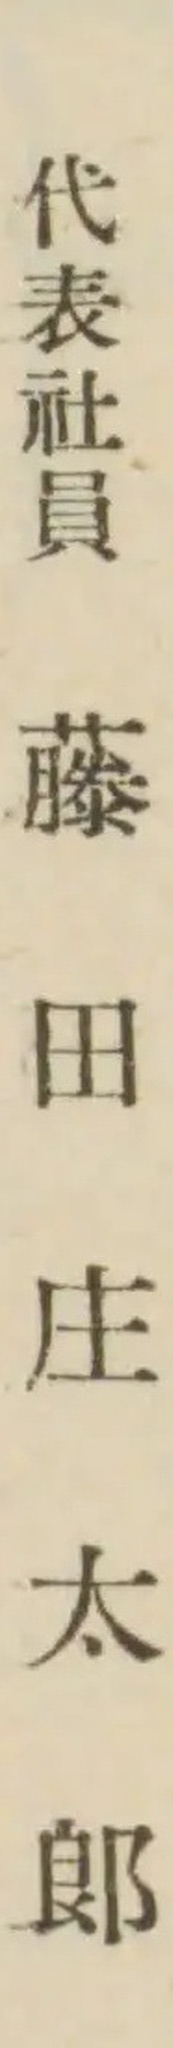代表社員藤田庄太郎

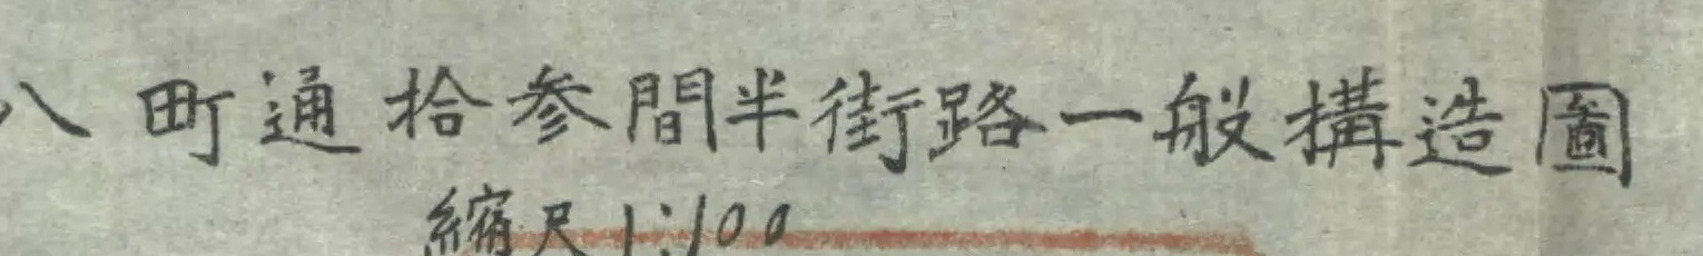八町通拾参間半街路一般構造図

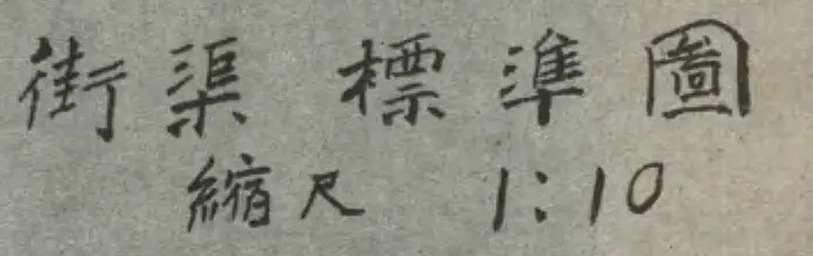街渠標準図
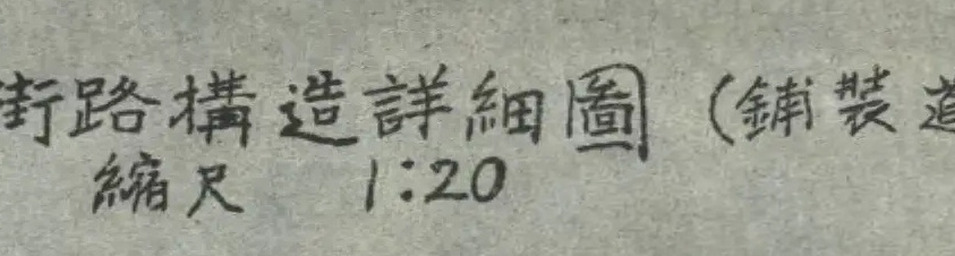街路構造詳細図(舗装道)
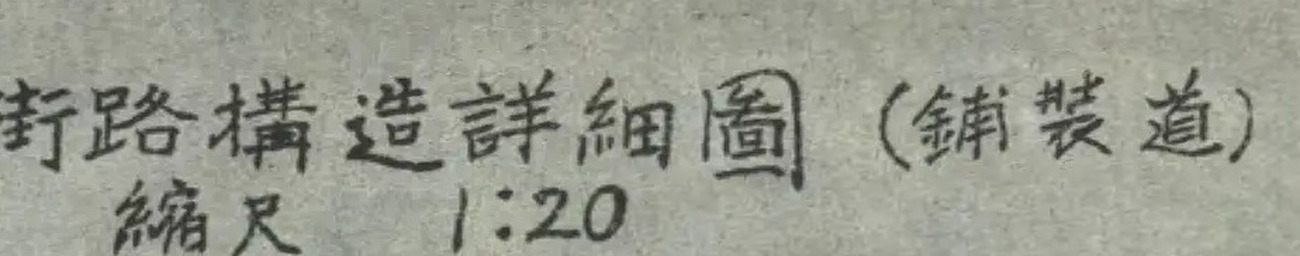街路構造詳細図(舗装道)
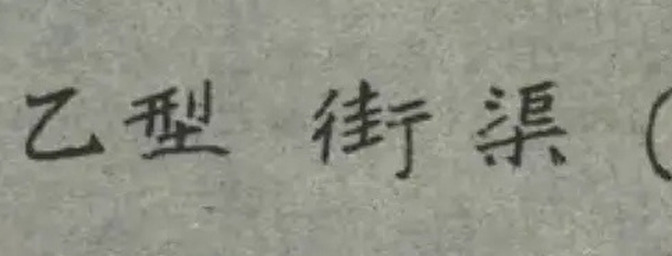乙型街渠

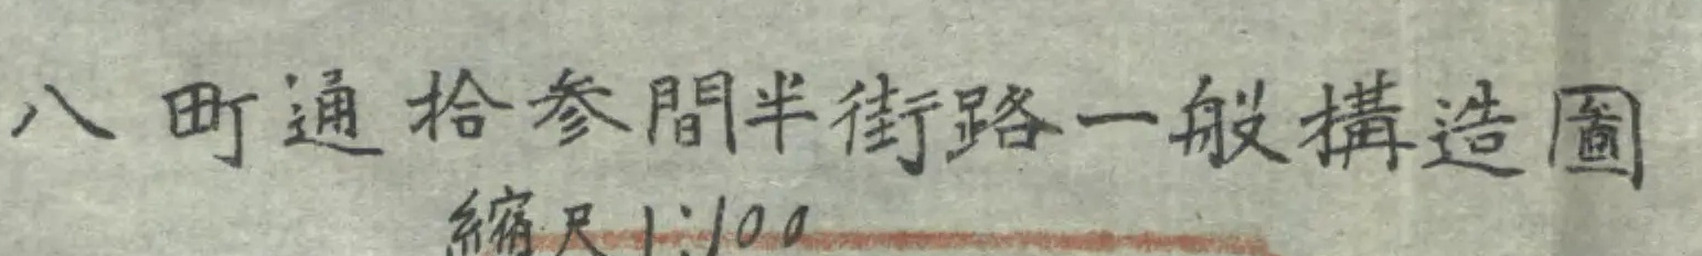八町通拾参間半街路一般構造図

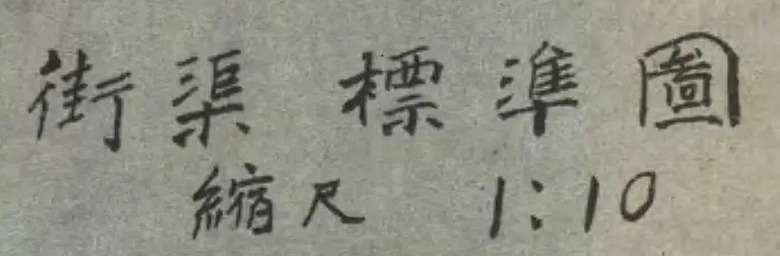街渠標準図
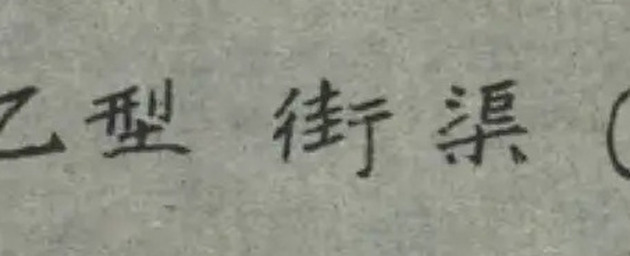乙型街渠
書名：豊橋市都市計画第一期事業報告書
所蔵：国立国会図書館 National Diet Library, JAPAN
